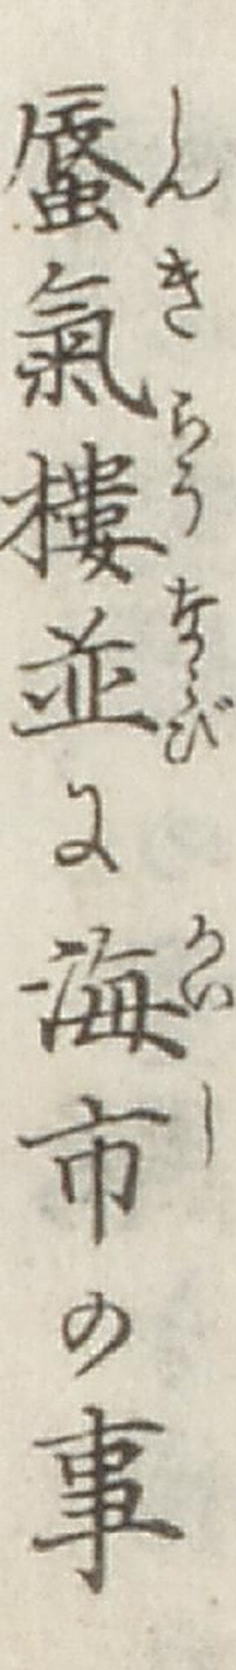蜃気楼並に海市の事
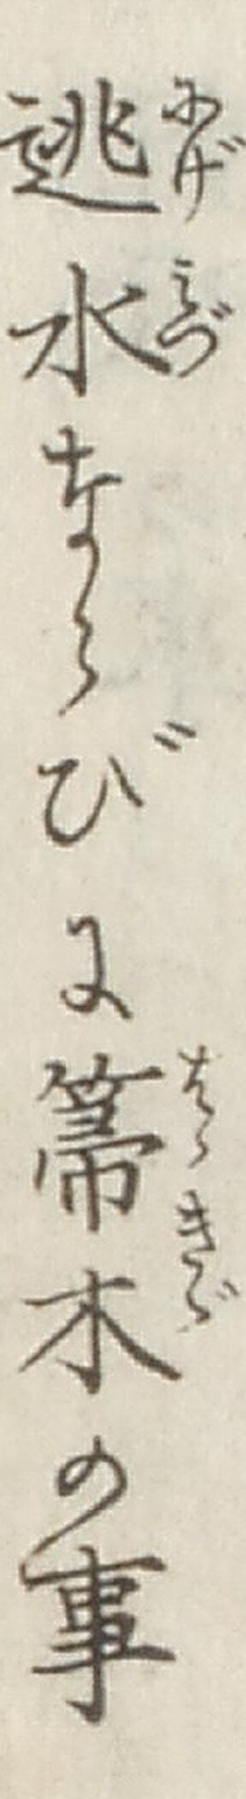逃水ならびに箒木の事
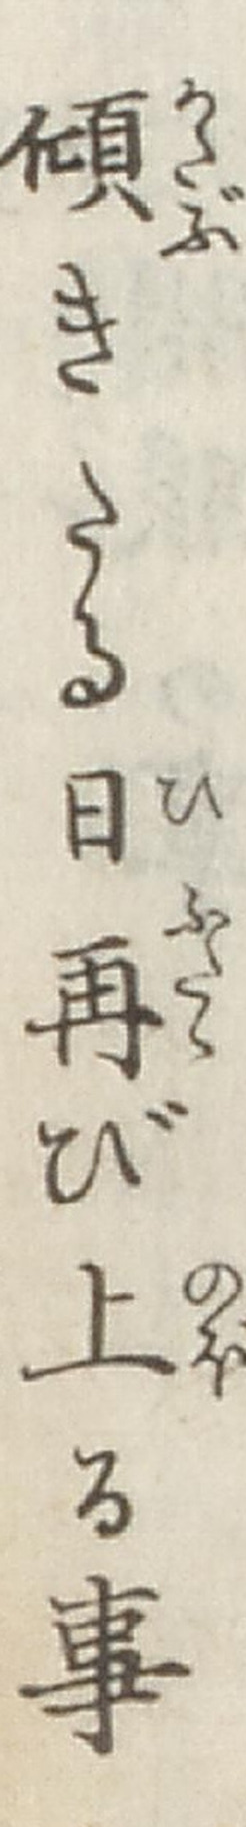傾きたる日再び上る事
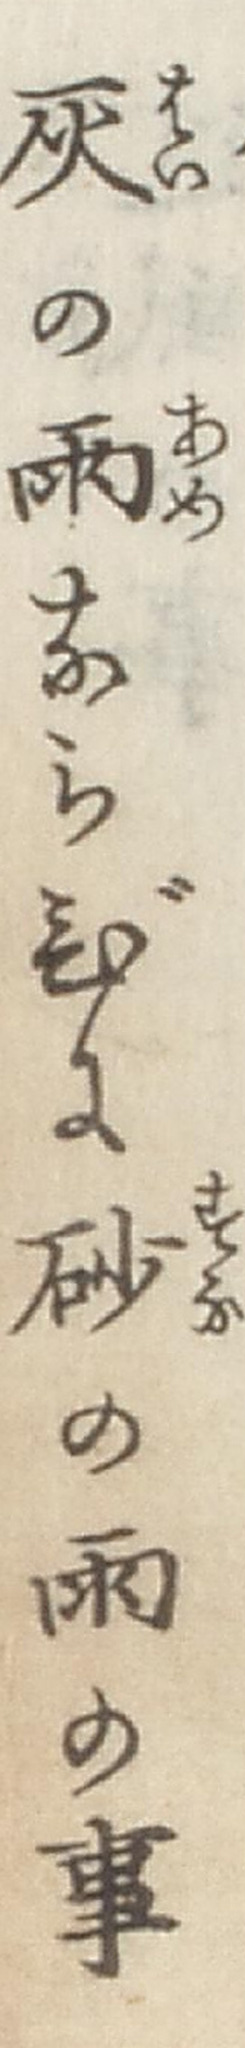灰の雨ならびに砂の雨の事
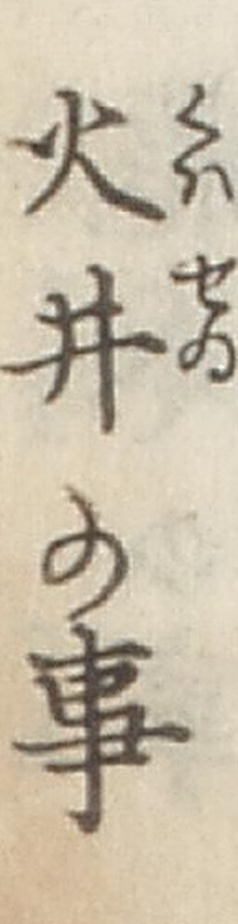火井の事
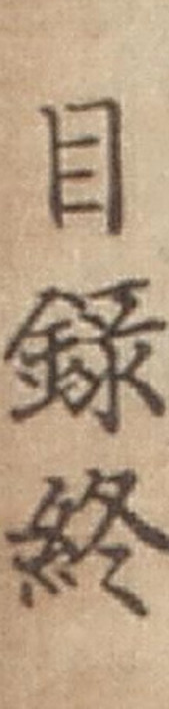目録終
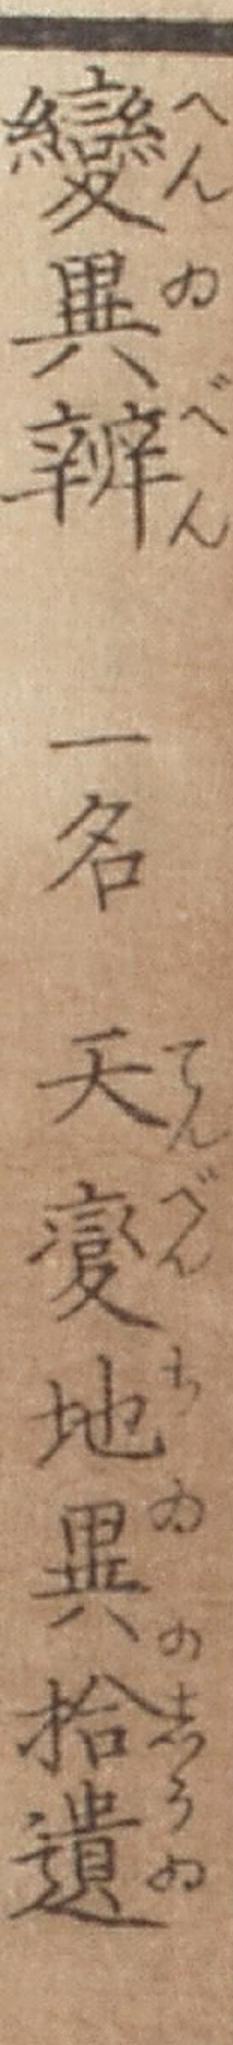変異辨一名天変地異拾遺
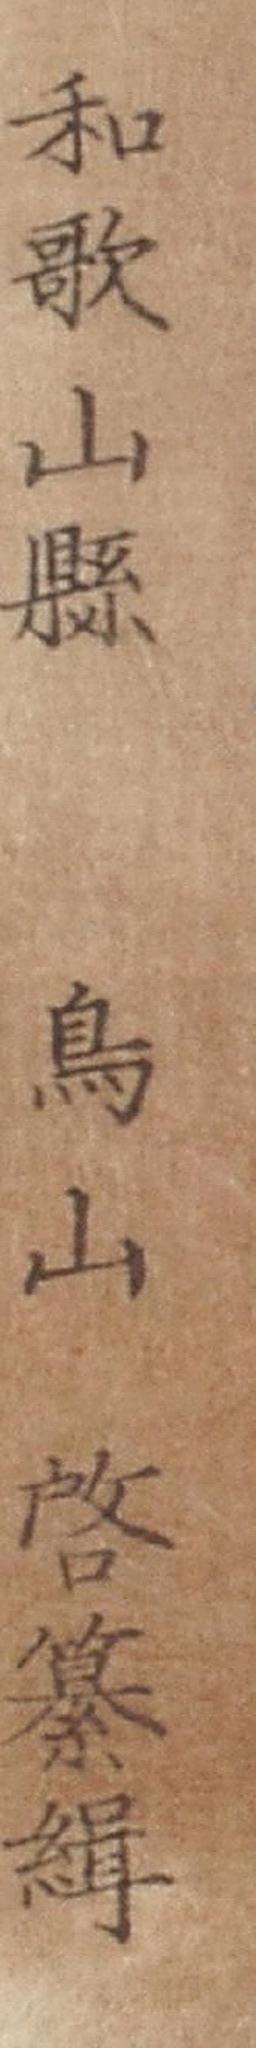和歌山県鳥山啓纂緝
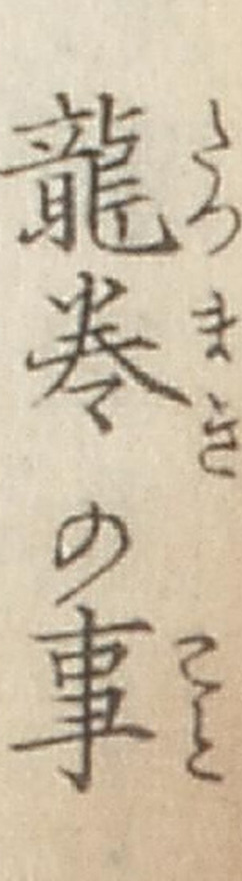龍巻の事
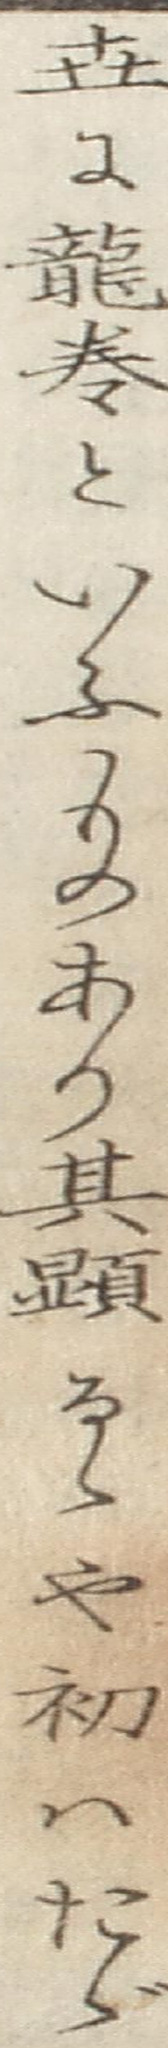世に龍巻といふものあり、其顕るゝや初はたゞ
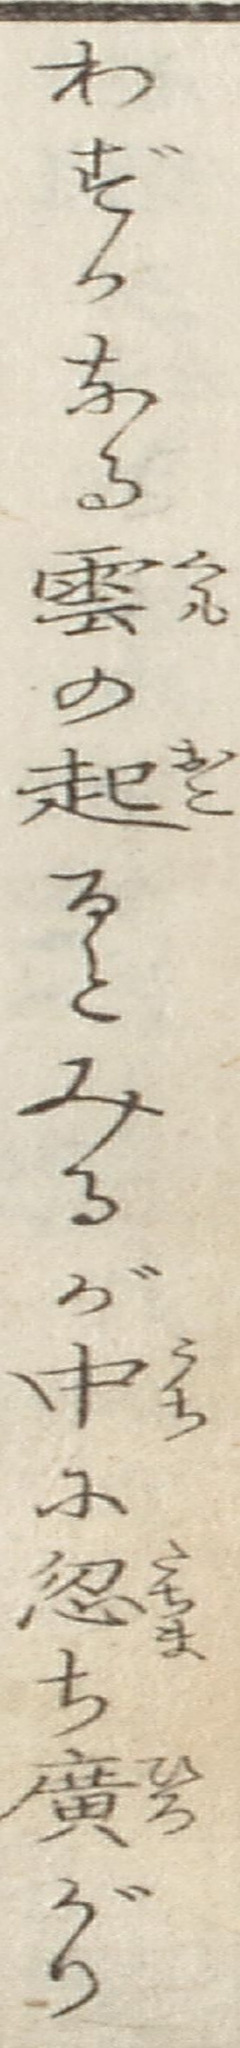わずかなる雲の起るとみるが中に忽ち広がり
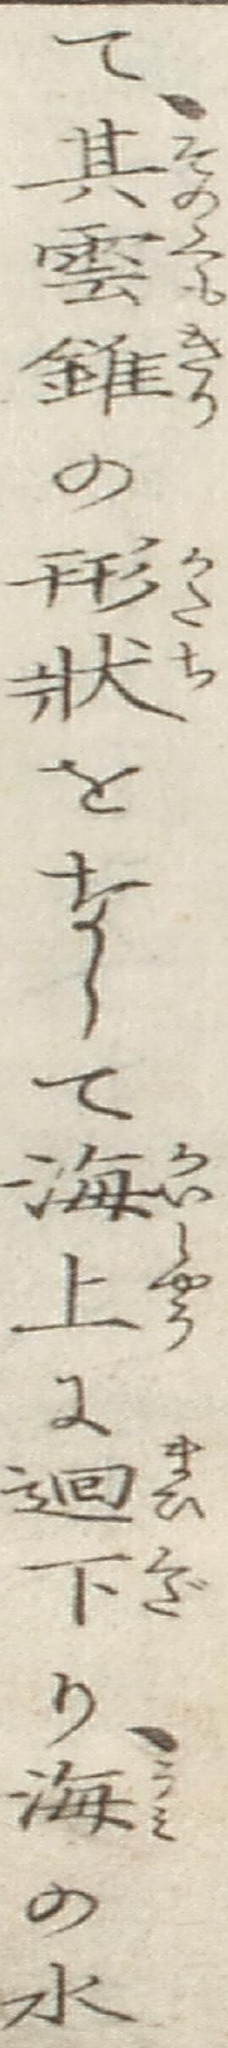て、其雲錐の形状をなして海上に廻下り、海の水
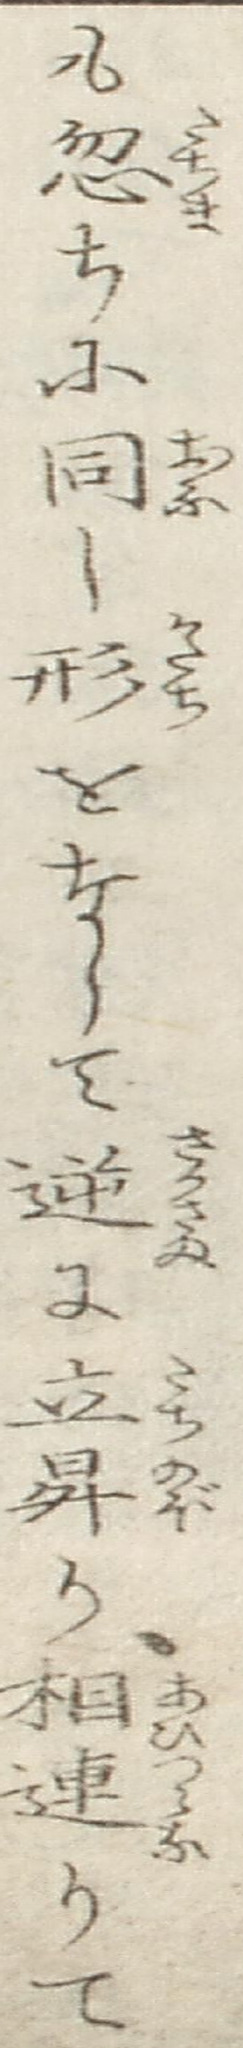も忽ちに同し形をなして逆に立昇り、相連りて
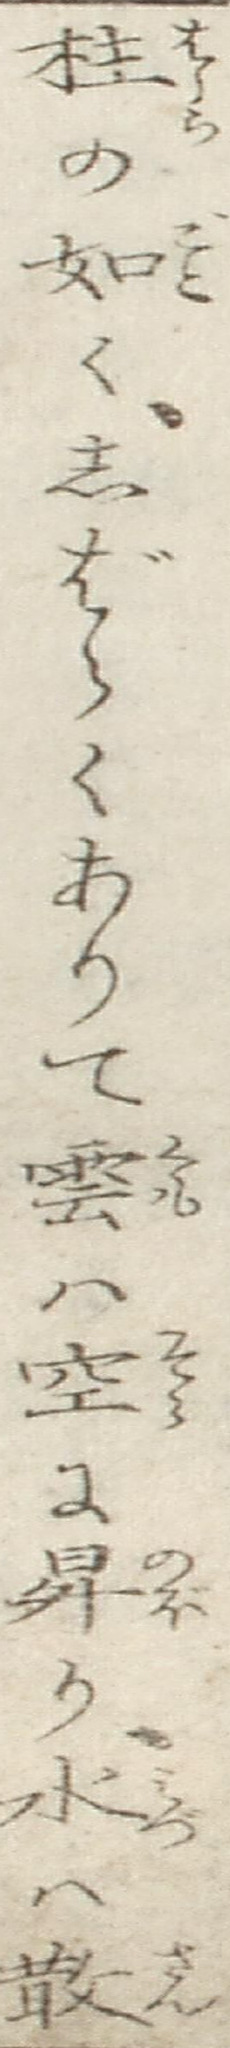柱の如く、しばらくありて雲は空に昇り、散
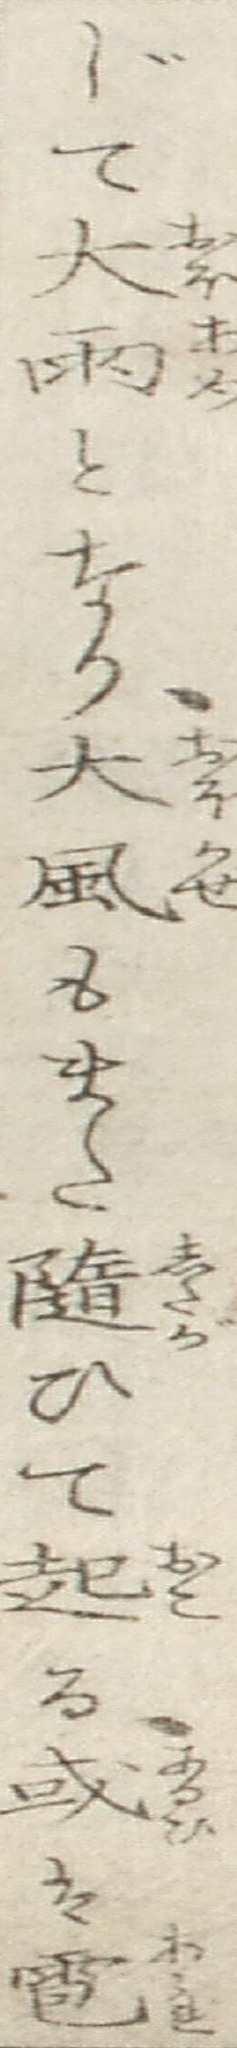じて大雨となり、大風もまた随ひて起る、或は雹

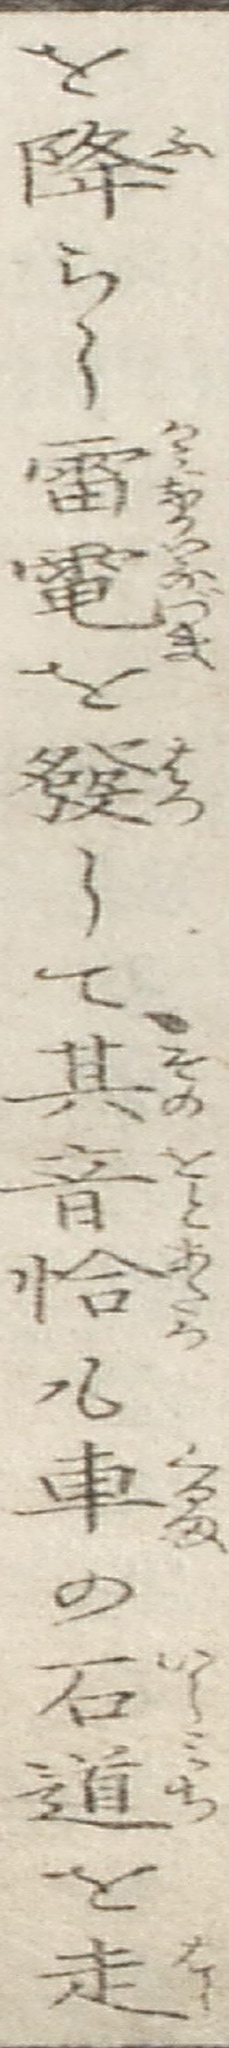を降らし雷電を発して、其音恰も車の石道を走
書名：変異辯　一名、天變地異拾遺　全
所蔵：東京大学地震研究所図書室 Earthquake Research Institute Library, The University of Tokyo, JAPAN
